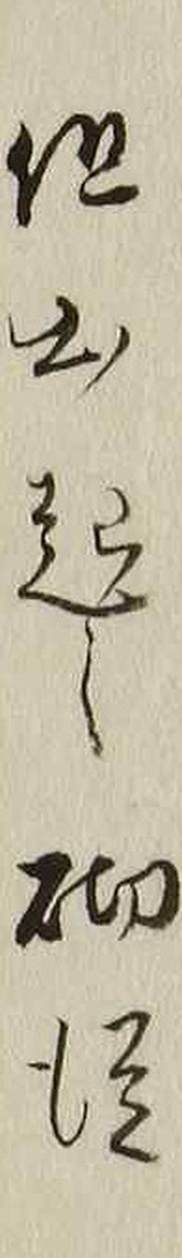但出起之砌従
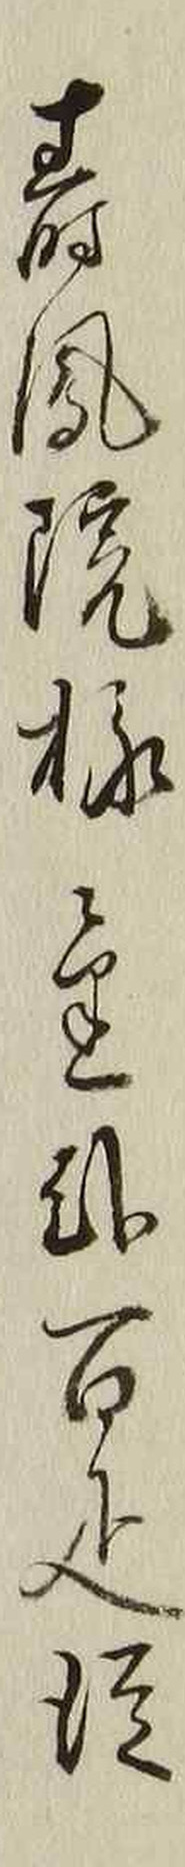寿鳳院様金弐百疋従
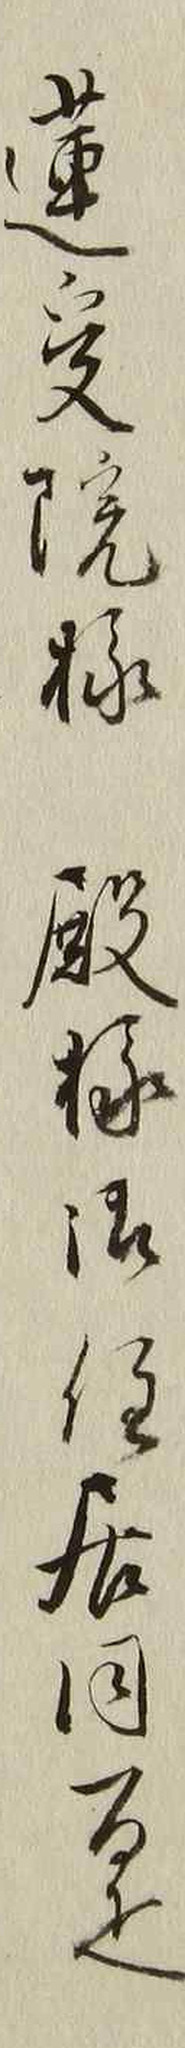蓮受院様殿様御住居同百疋
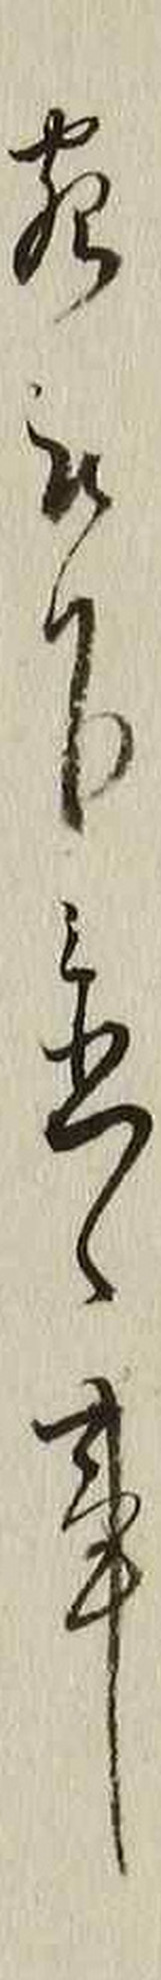宛被下置候事
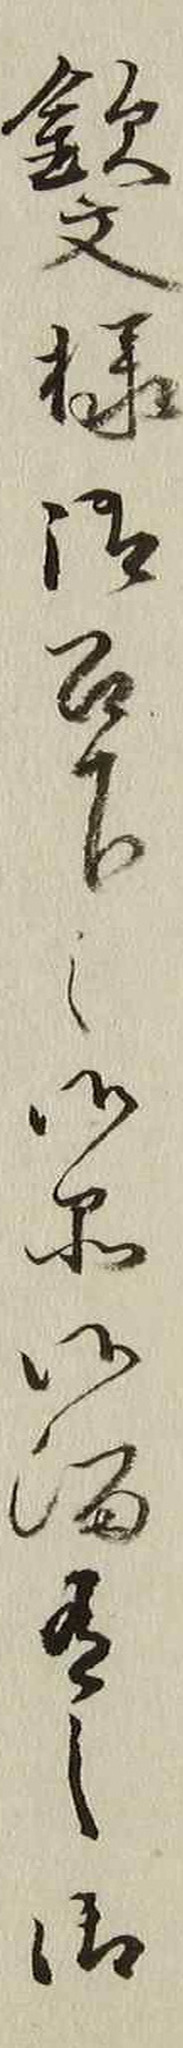欽文様御召下之御品御酒有之御
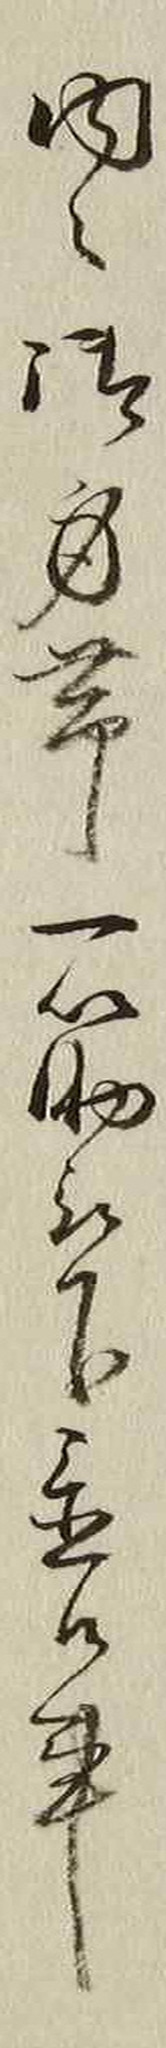内々御身帯一筋被下置候事
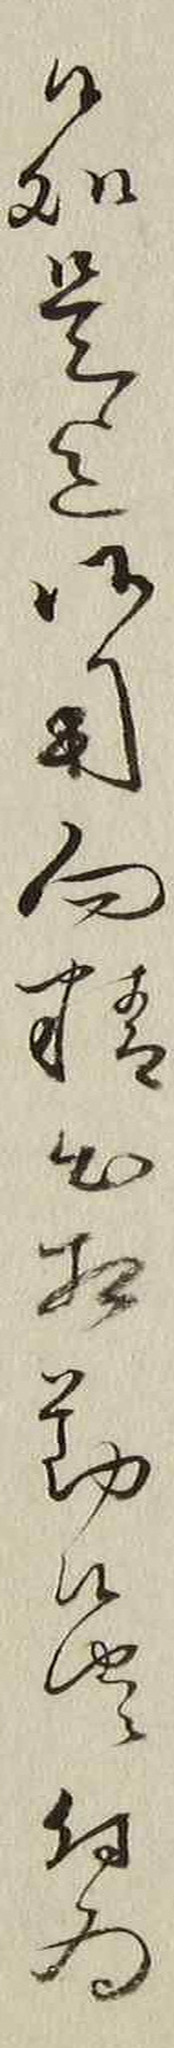候処是迄御用向精出相勤候由付為
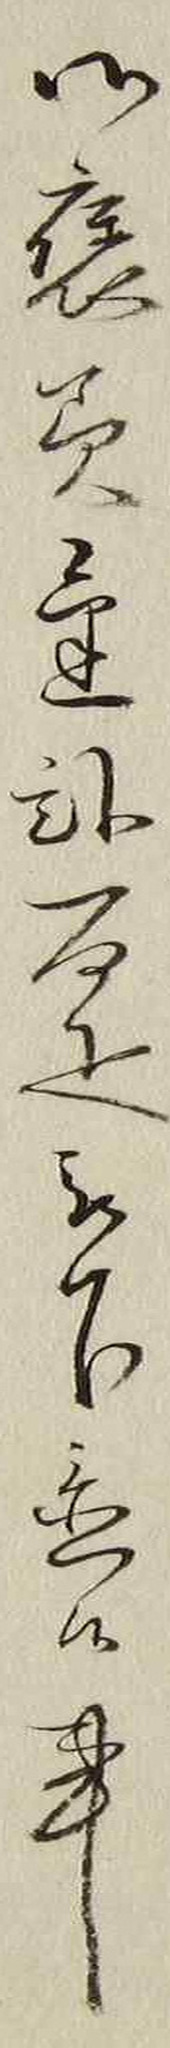御褒美金弐百疋被下置候事
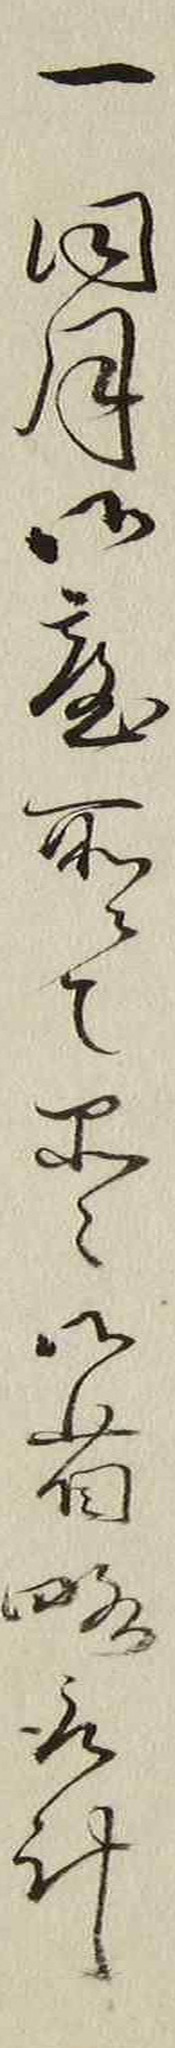一同月御台所ニて品々省略取計
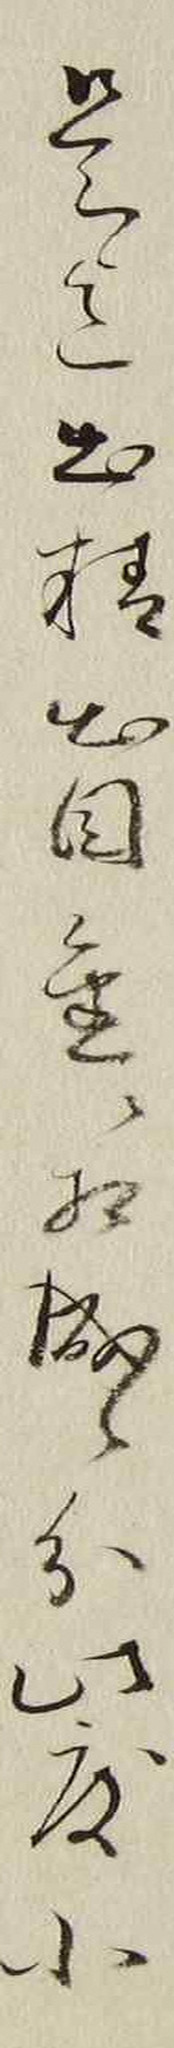是迄出精出目金相成候分此度小
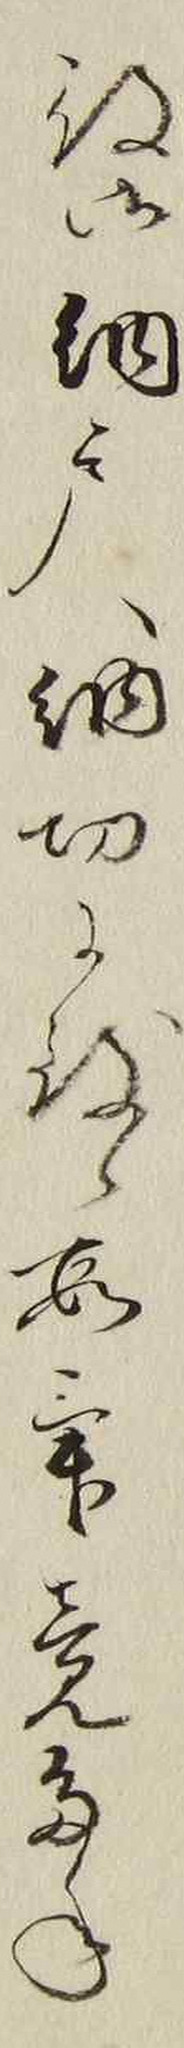役御納戸へ納切に致候段畢竟多年
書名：諸士系譜　巻之10　い之部10
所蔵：会津若松市立会津図書館
